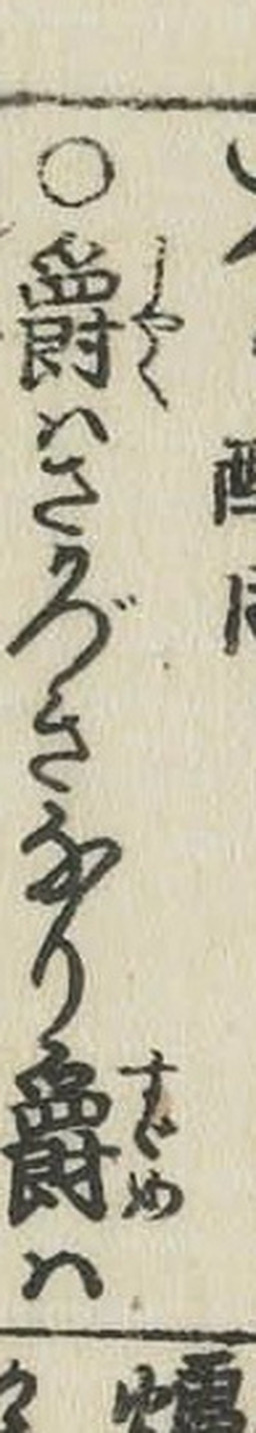○爵はさかづきなり爵は
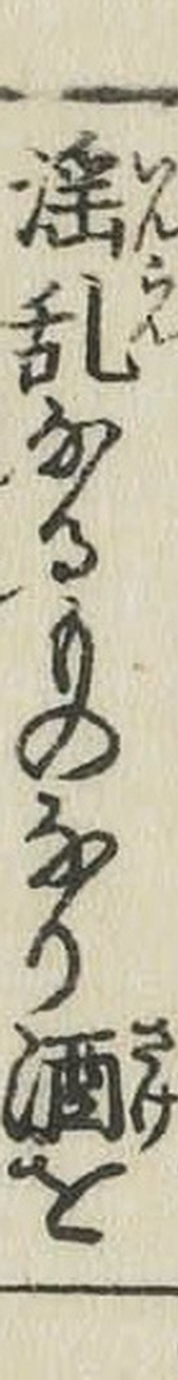淫乱なるものなり酒を
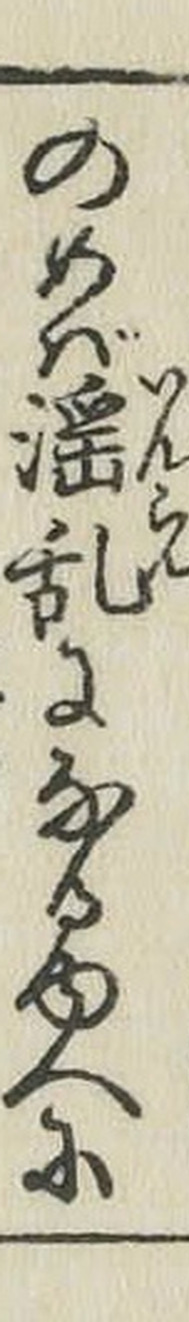のめば淫乱になるゆへに
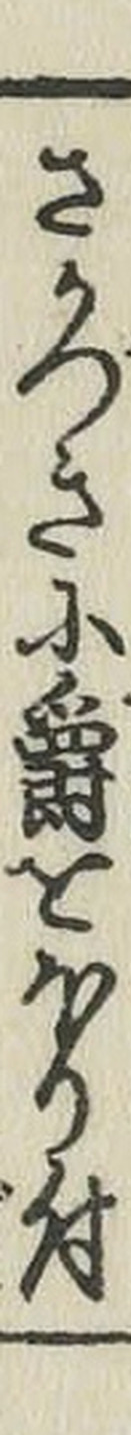さかづきに爵をほり付
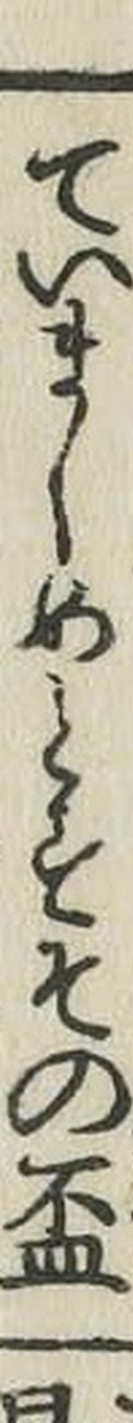ていましめとすその盃
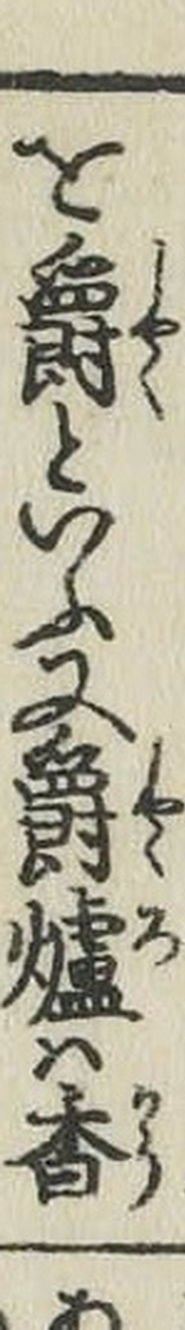を爵といふ又爵炉は香
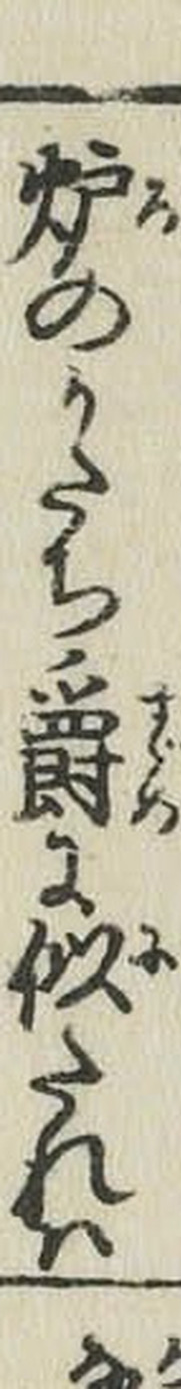炉のかたち爵に似たれは
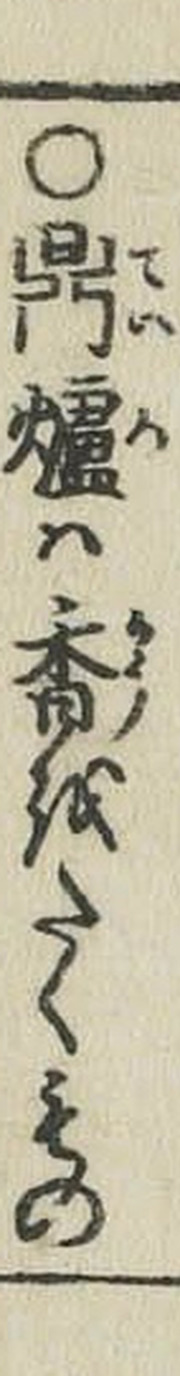○鼎炉は香をたくもの

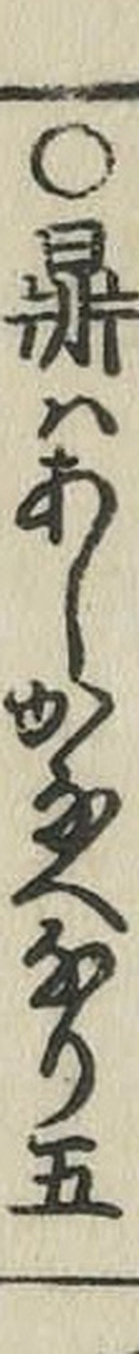○鼎はあしかなへなり五
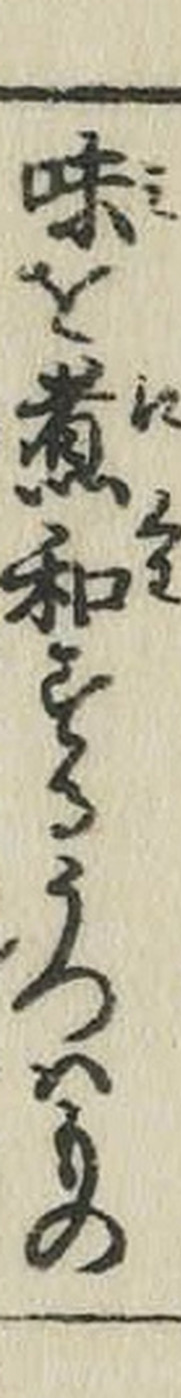味を煮和するうつはもの
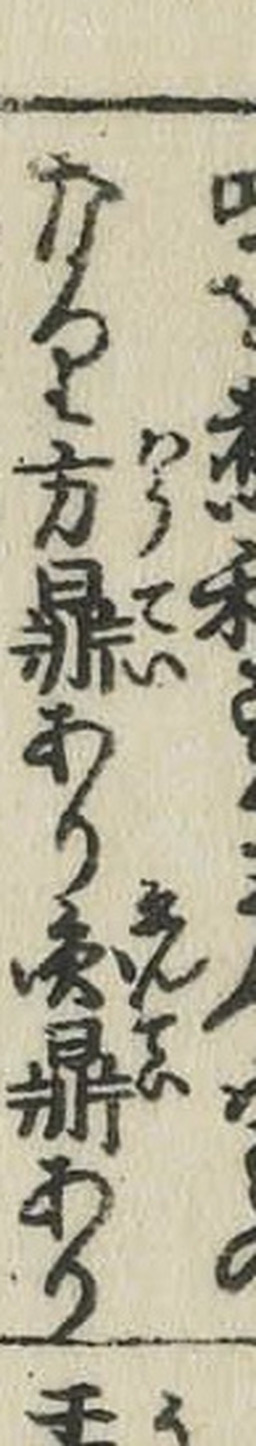なり方鼎あり円鼎あり
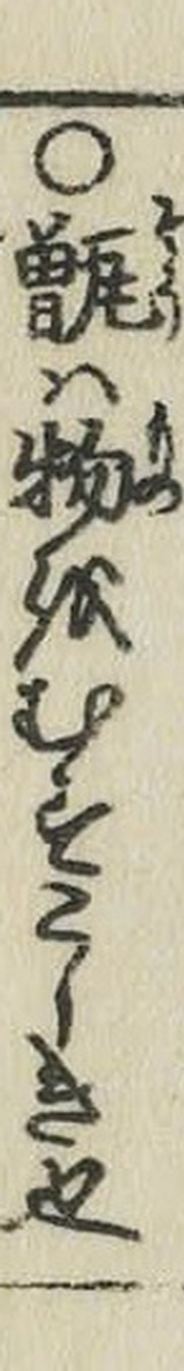○甑は物をむすこしき也
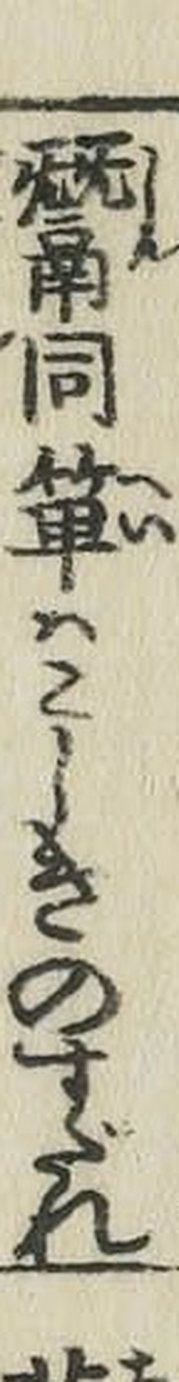鬵同箄はこしきのすだれ
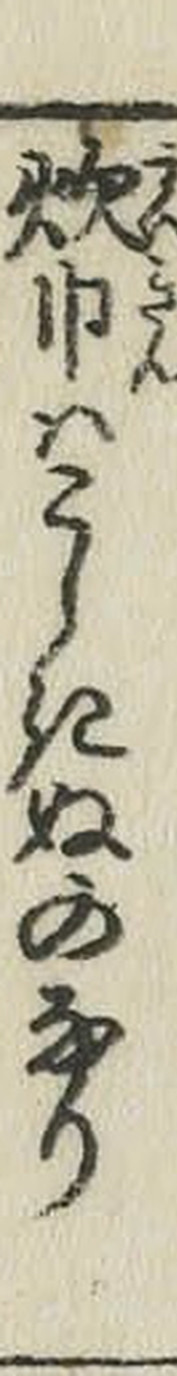炊巾はこしきぬのなり
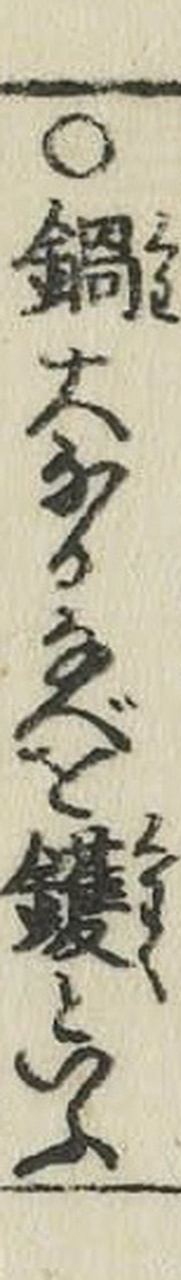○鍋大なるなべを鑊といふ
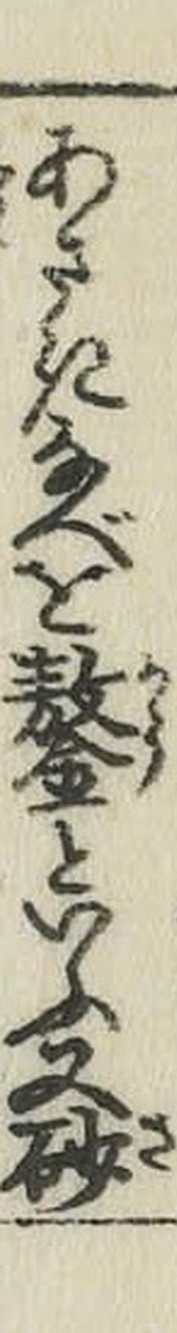あさきなべを鏊といふ又砂
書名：増補頭書訓蒙図彙大成 10巻 5:巻之9-11
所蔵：東京学芸大学教育コンテンツアーカイブ
